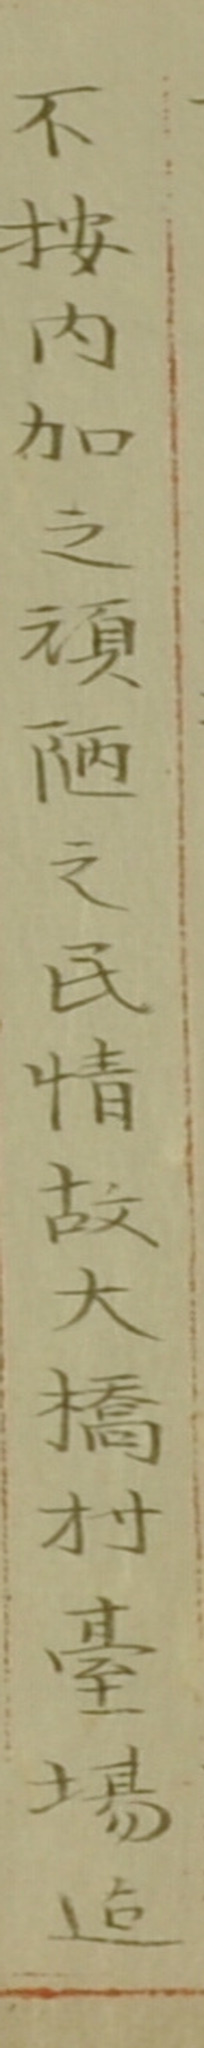不按内加之頑陋之民情故大橋村台場迄
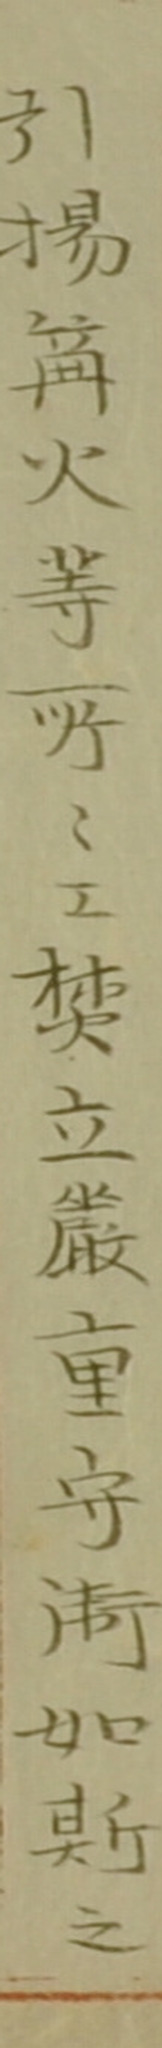引揚篝火等所々エ焚立厳重守衛如斯之
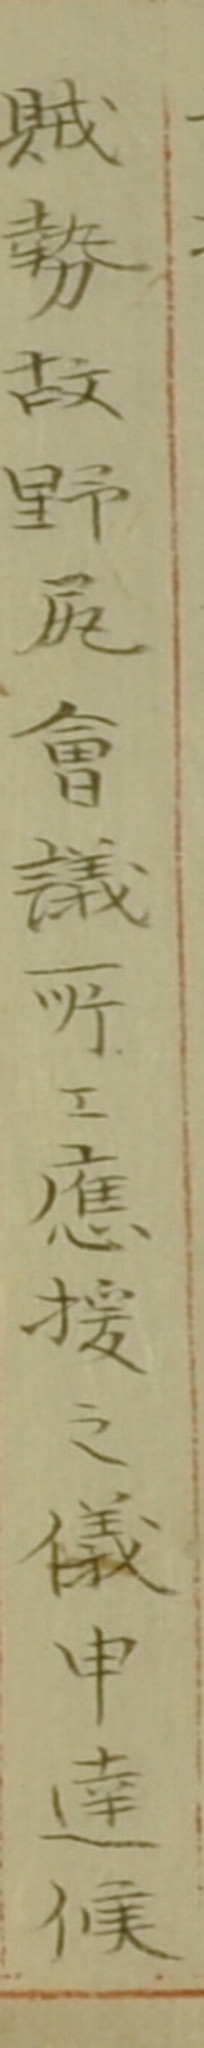賊勢故野尻会議所エ応援之儀申達候
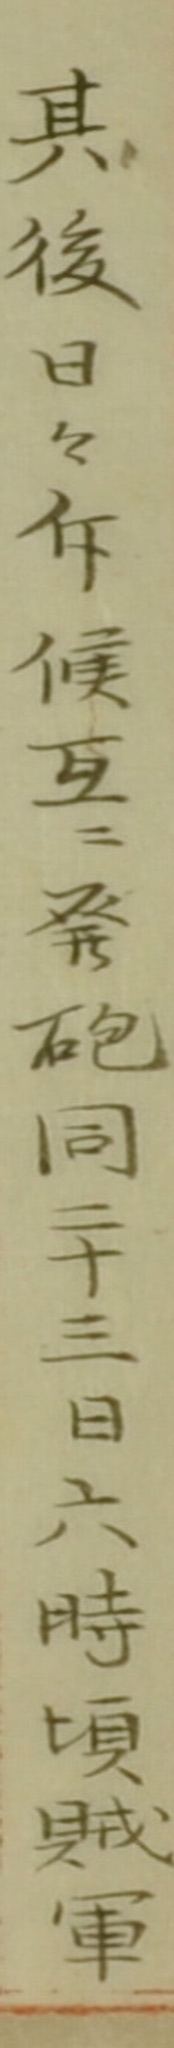其後日々斥候互ニ発砲同二十三日六時頃賊軍
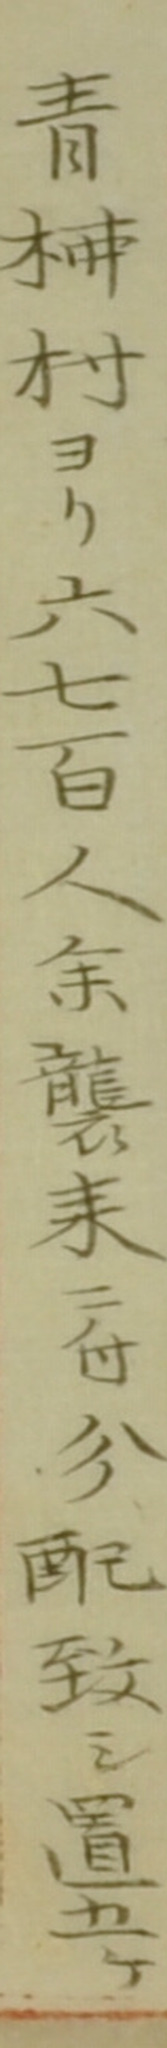青柳村ヨリ六七百人余襲来ニ付分配致シ置五ヶ
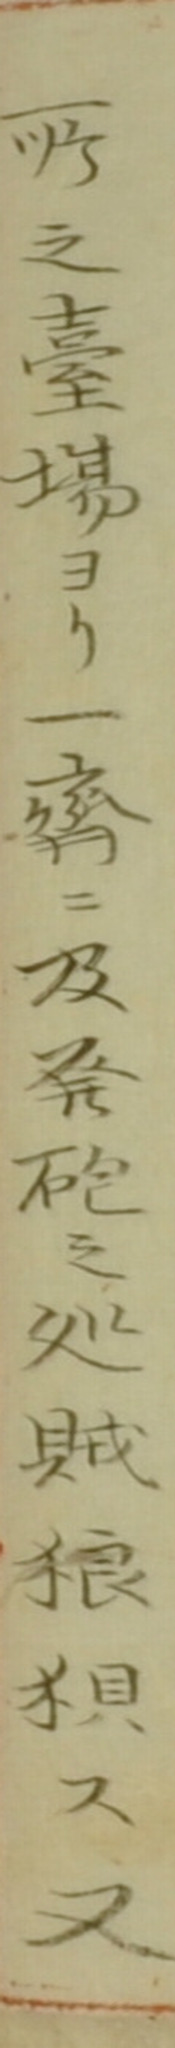所之台場ヨリ一斉ニ及発砲之処賊狼狽ス又
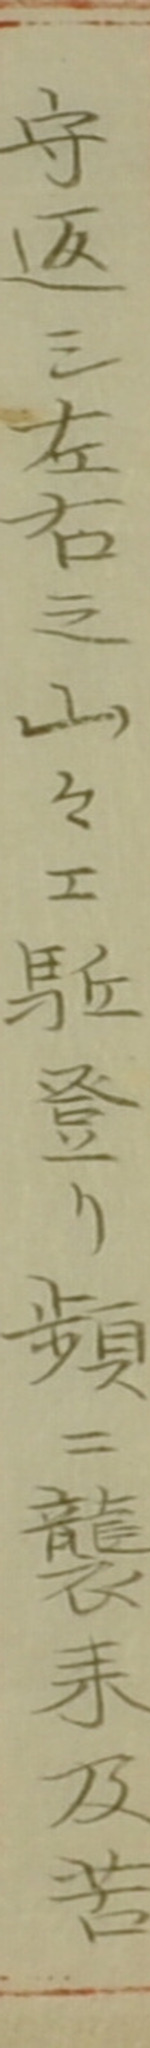守返シ左右之山々エ駈登リ頻ニ襲来及苦
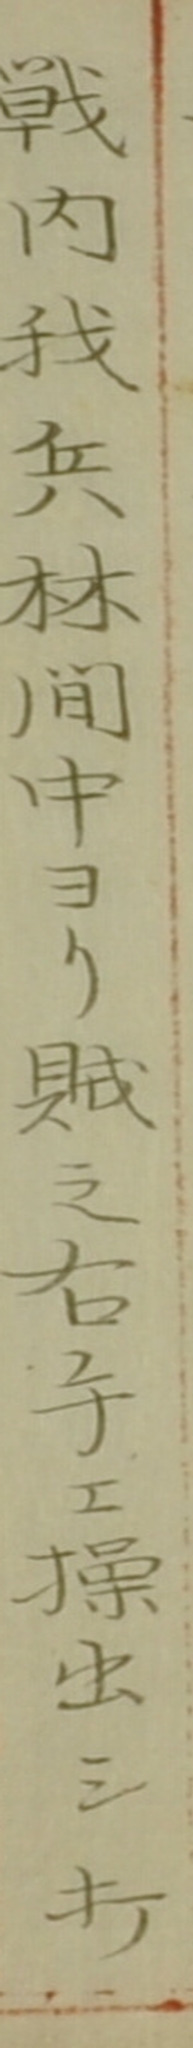戦内我兵林間中ヨリ賊之右手エ繰出シ打
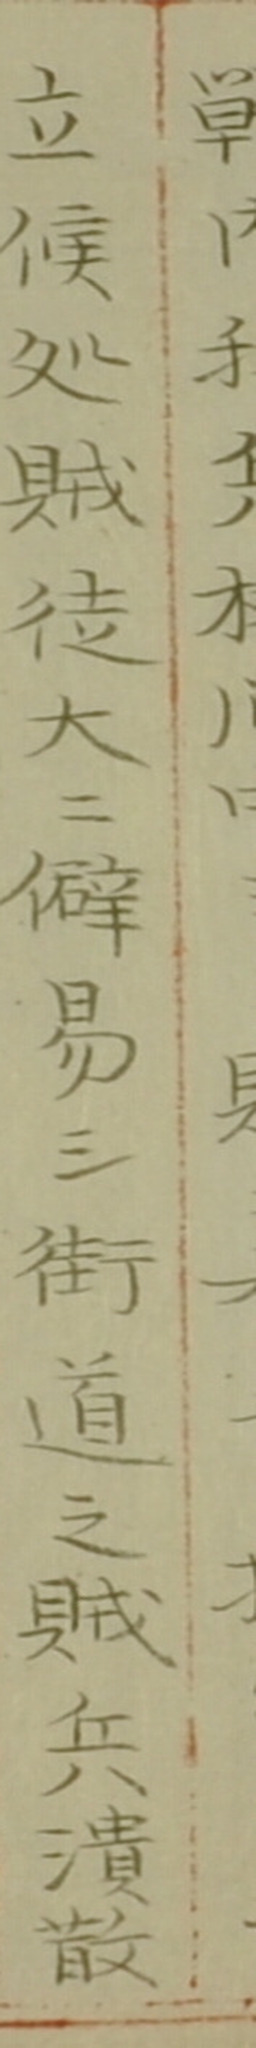立候処賊徒大ニ僻易シ街道之賊兵潰散
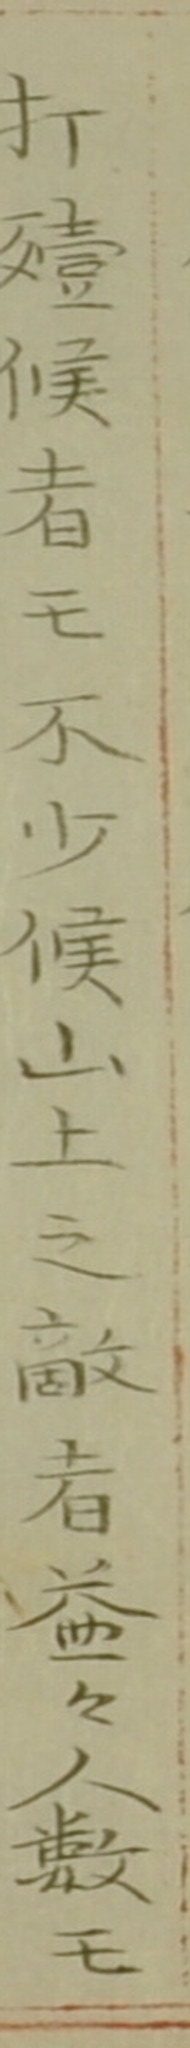打殪候者モ不少候山上之敵者益々人数モ
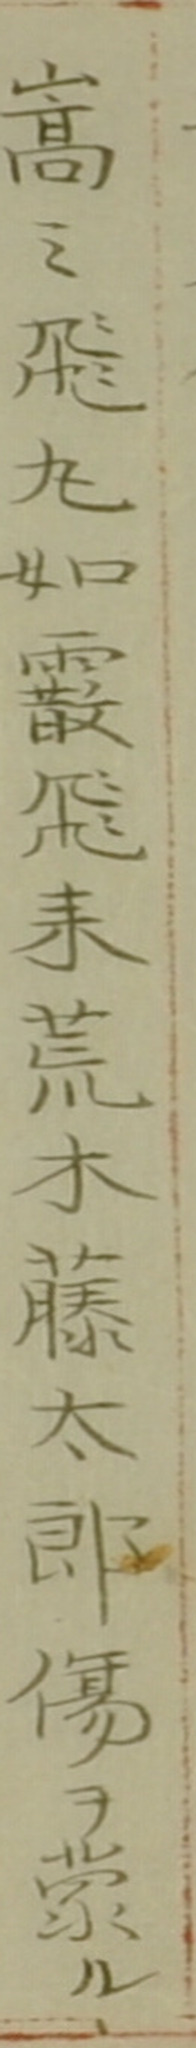嵩之飛丸如霰飛来荒木藤太郎傷ヲ蒙ル
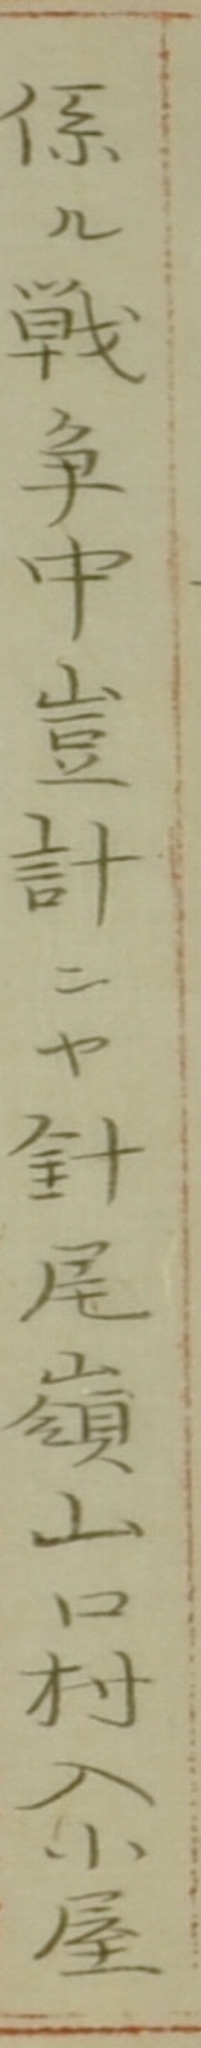係ル戦争中豈計ンヤ針尾嶺山口村小屋
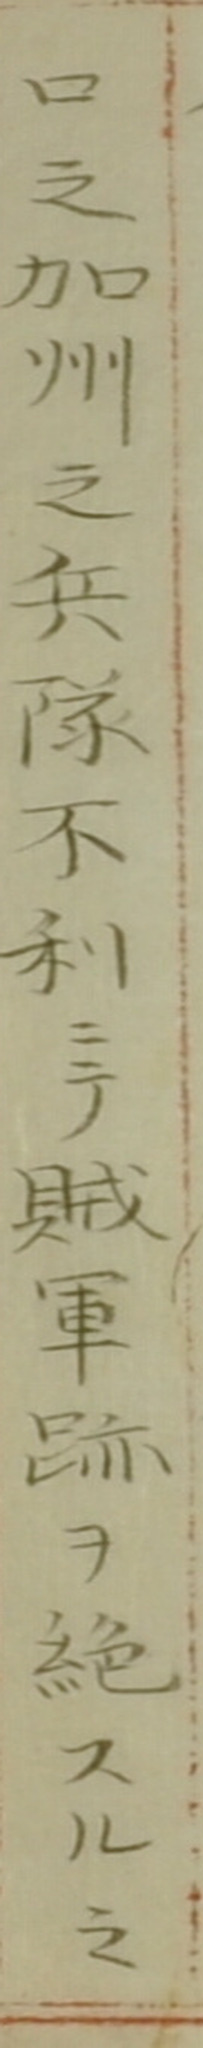口之加州之兵隊不利ニテ賊軍跡ヲ絶スル之
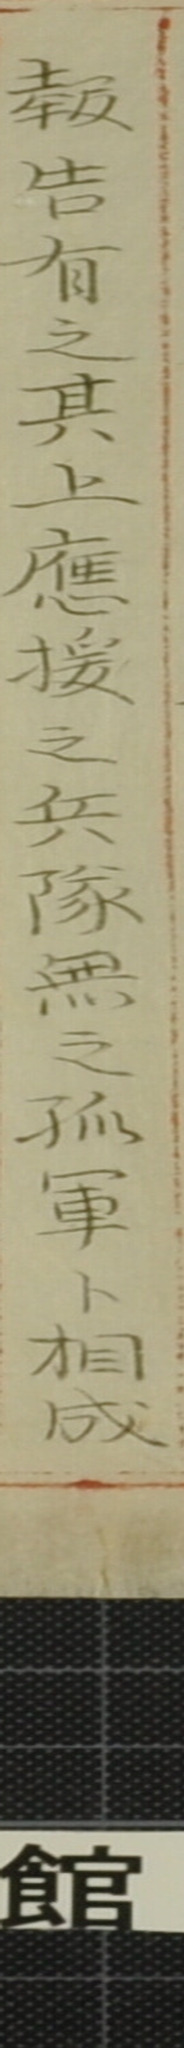報告有之其上応援之兵隊無之孤軍ト相成
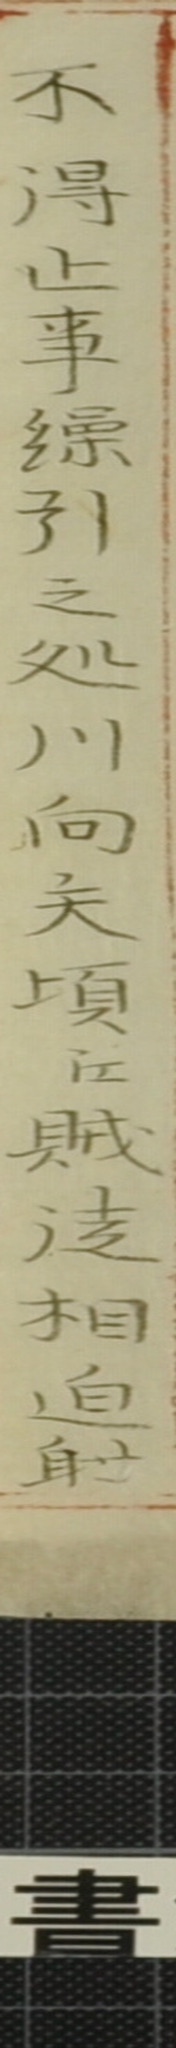不得止事繰引之処川向矢頃江賊徒相迫射

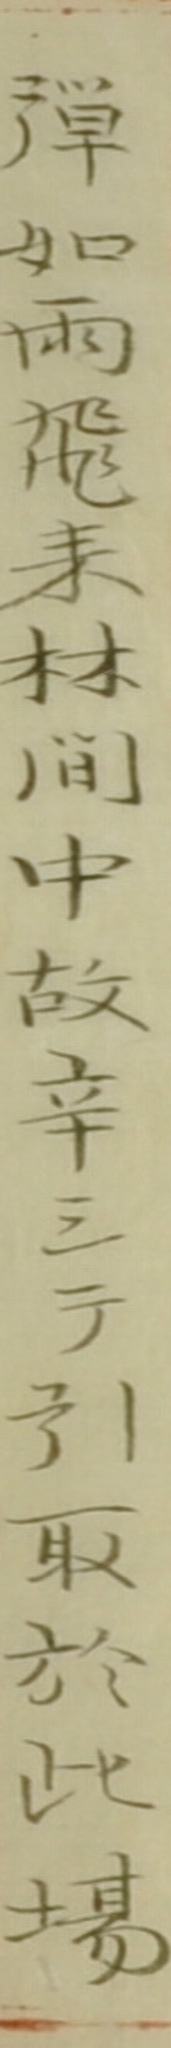弾如雨飛来林間中故辛シテ引取於此場
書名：奥越出兵中戦争之事件概略抄録（控）
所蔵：伊那市立高遠町図書館・合同会社AMANE
